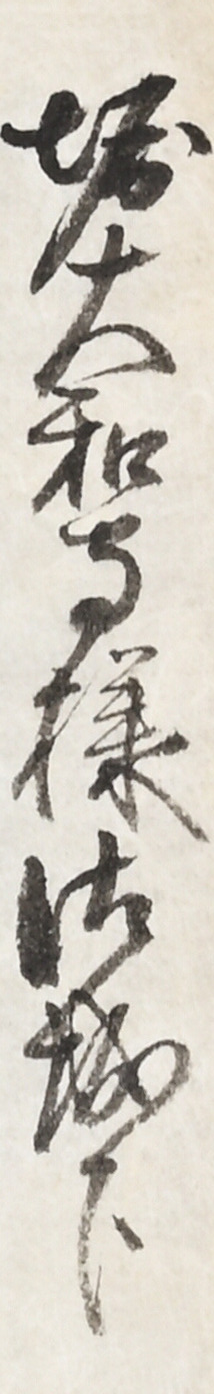堀大和守様御城下
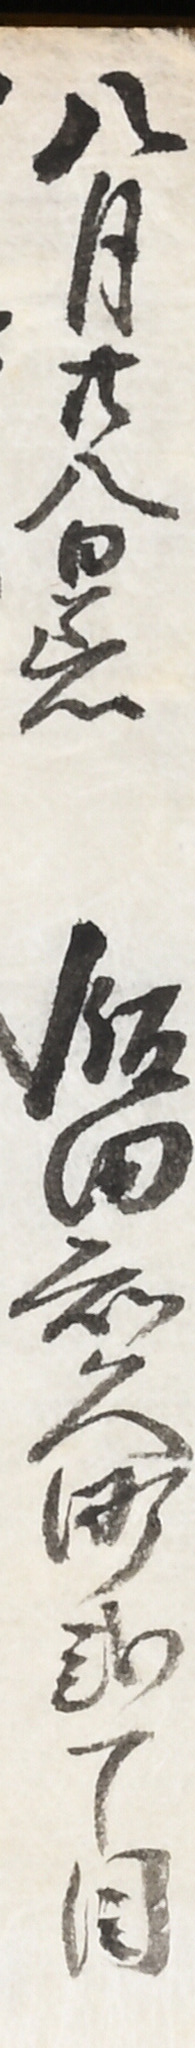八月廿八日着飯田知久町弐丁目
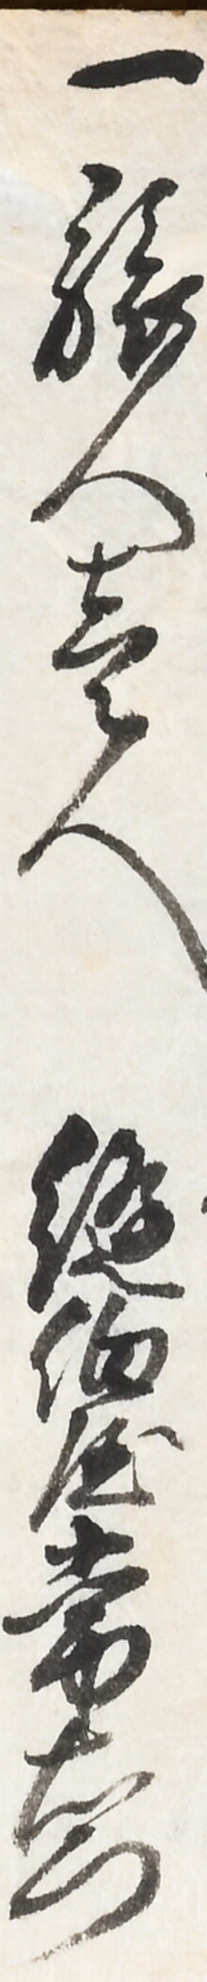一旅人壱人縫伯屋常右衛門
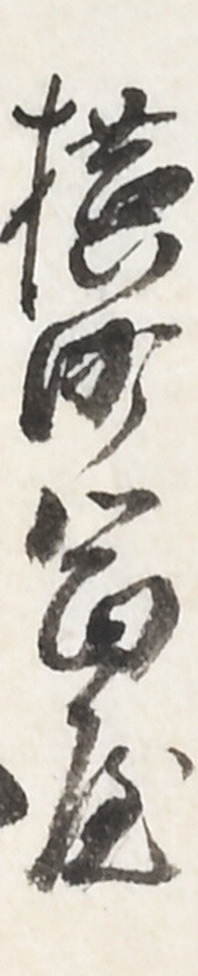横町冨屋
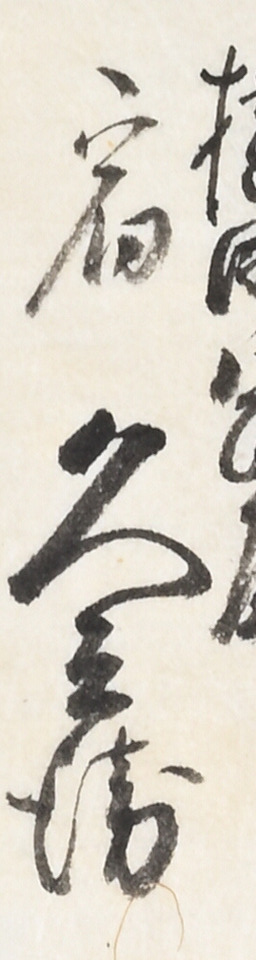宿久兵衛
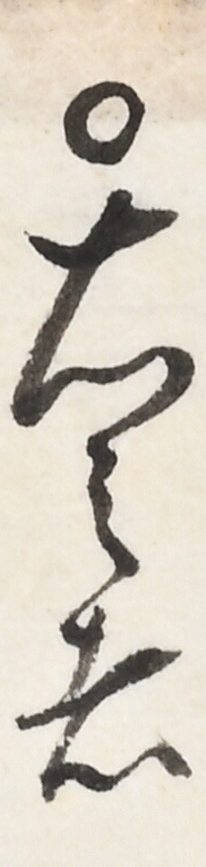〇右之者
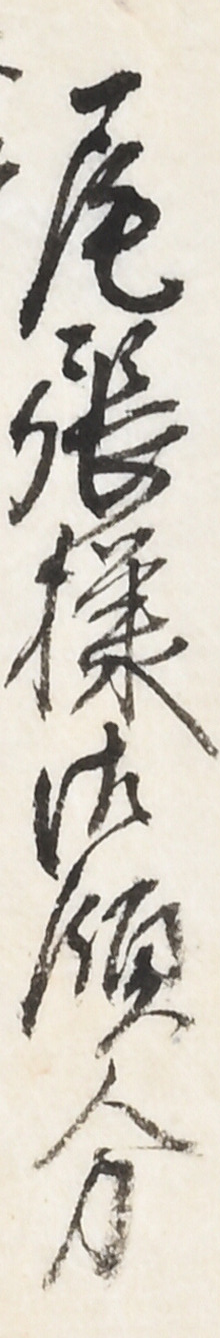尾張様御領分
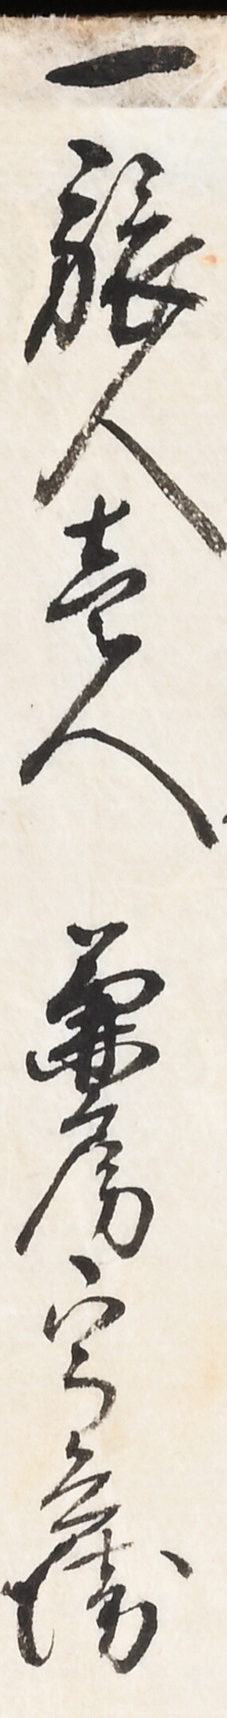一旅人壱人兼房宇兵衛
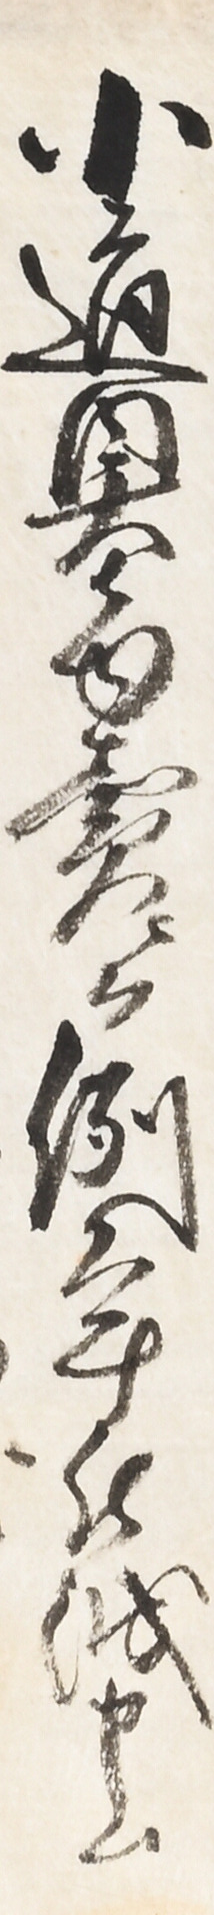小道具商売ニ而例年罷越申候
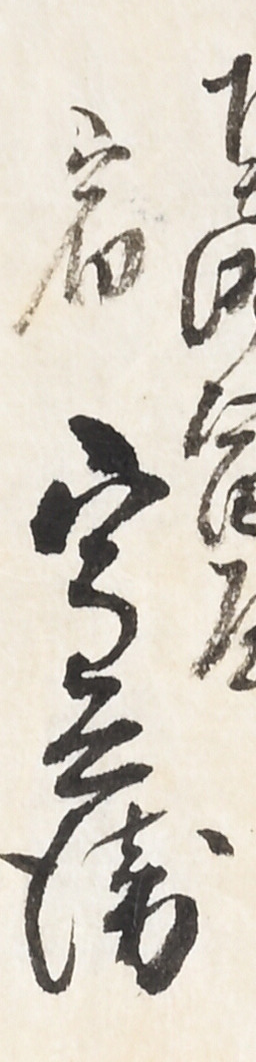宿宇兵衛
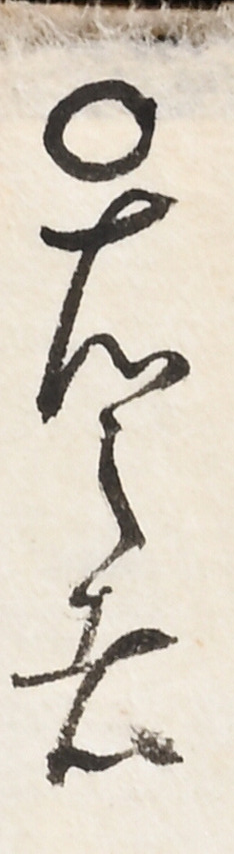〇右之者
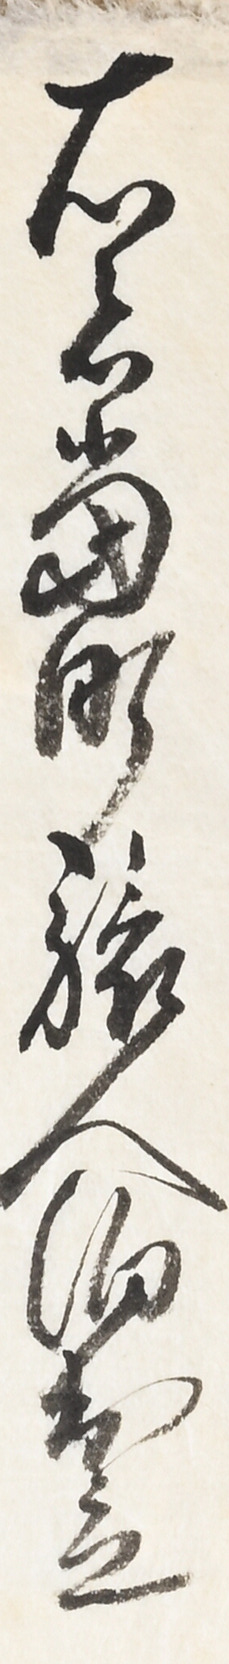右者当町旅人泊出立
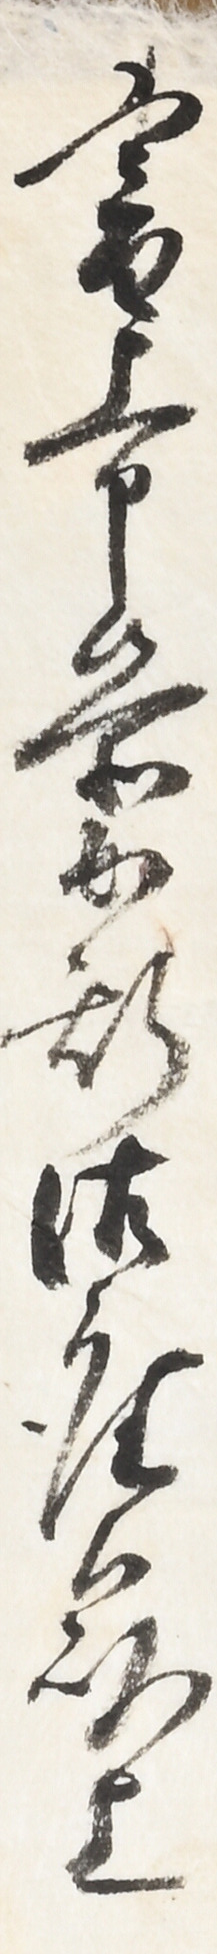書上申候所如斯御座候以上
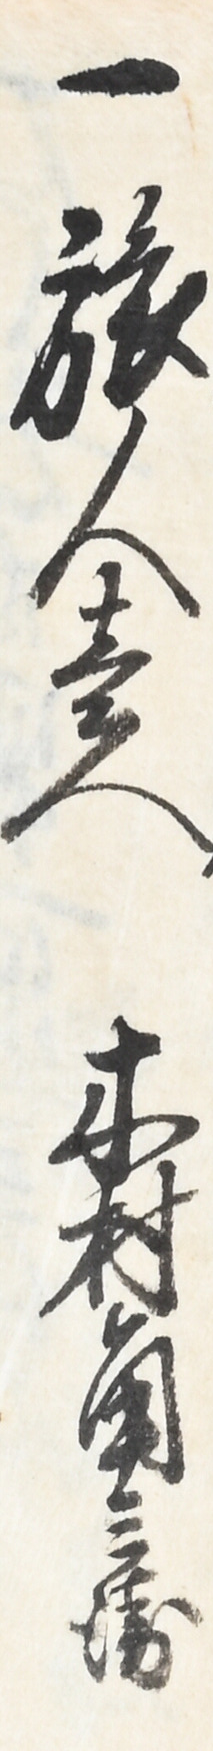一旅人壱人兼房宇兵衛
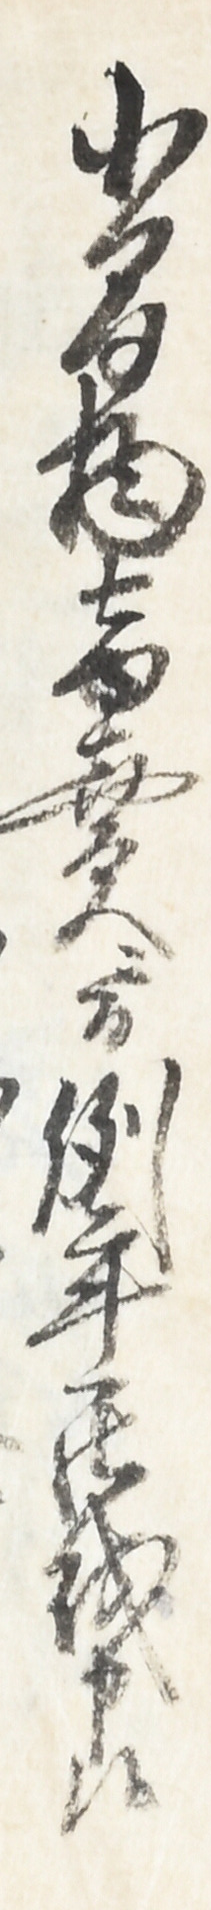小道具商売ニ而例年罷越申候

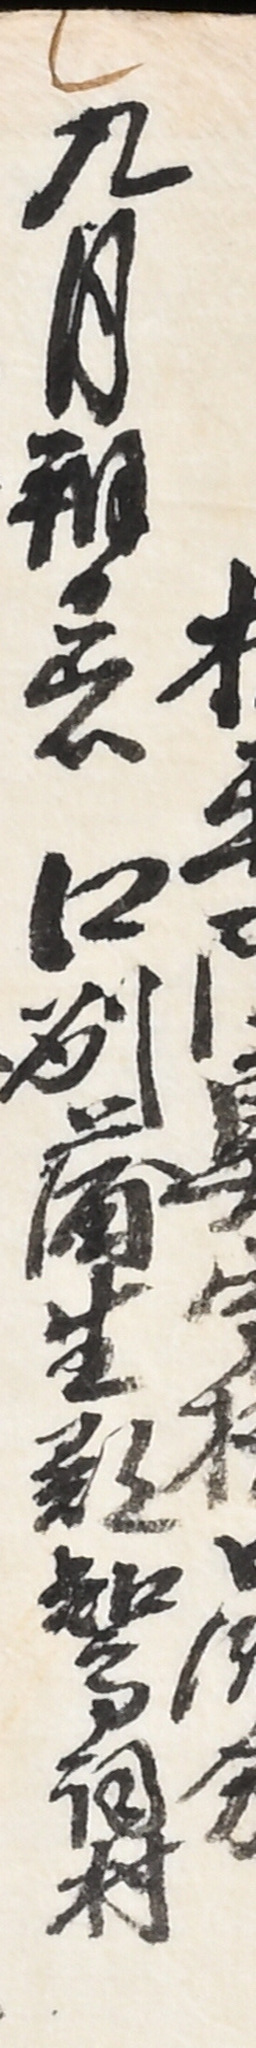九月朔日着江州蒲生郡駕詞村
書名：旅人泊控帳
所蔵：伊那市立高遠町図書館・合同会社AMANE
